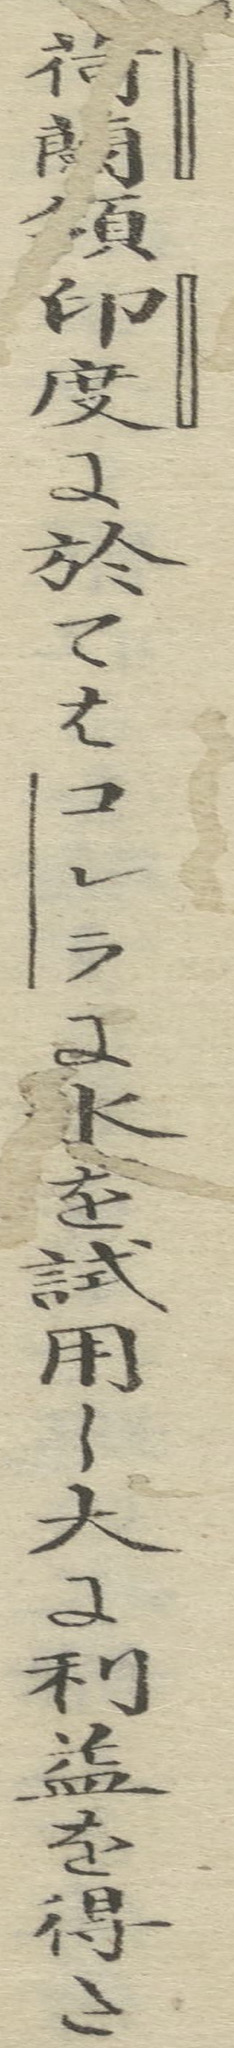荷蘭領印度に於てはコレラに水を試用し大に利益を得た
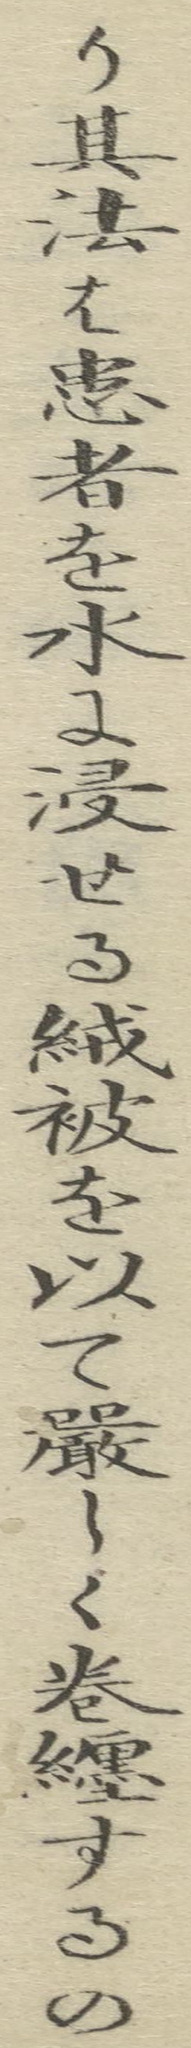り其法は患者を水に浸せる絨被を以て厳しく巻纏するの
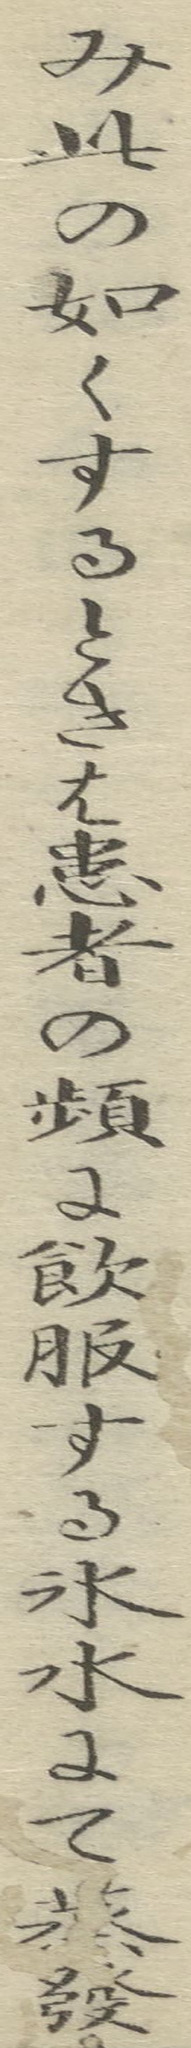み此の如くするときは患者の頻に飲服する氷水にて蒸發
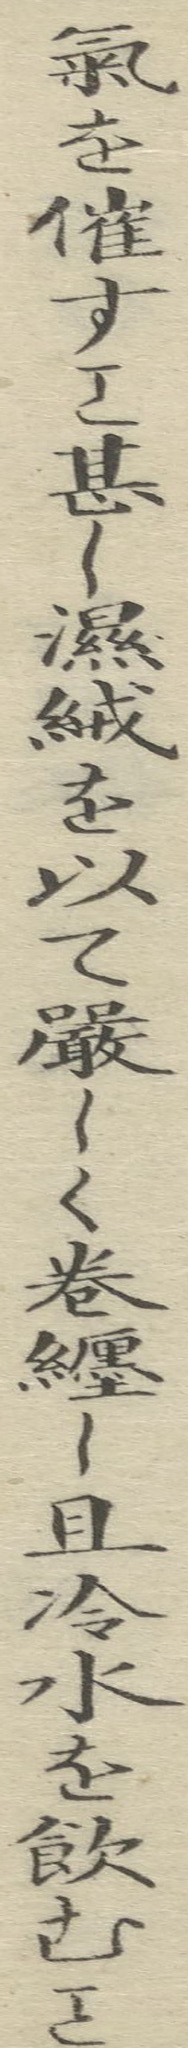氣を催すこと甚し濕絨を以て厳しく巻纏し且冷水を飲むこと
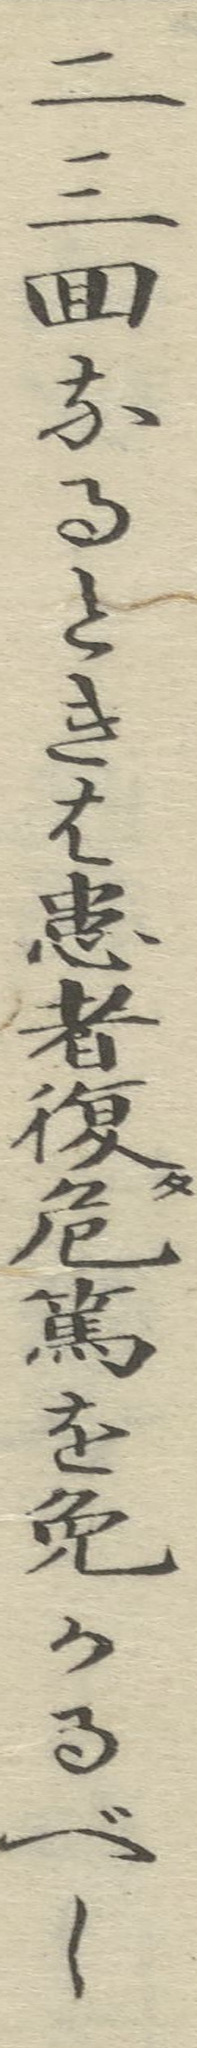二三回なるときは患者復危篤を免かるべし
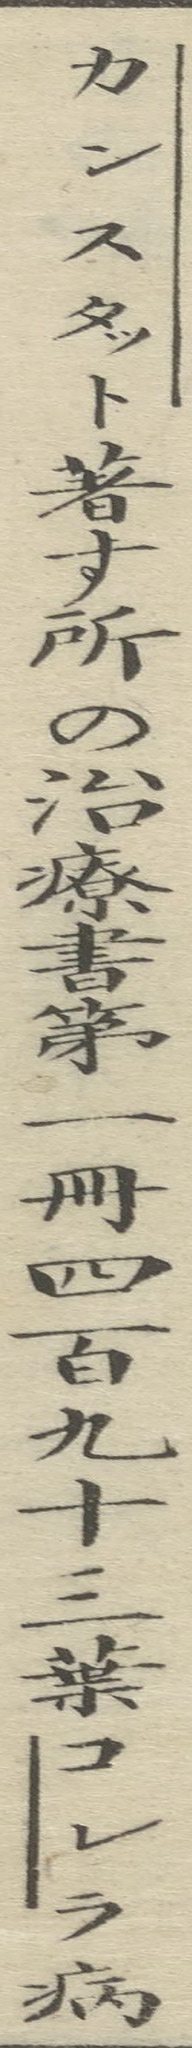カンスタット著す所の治療書第一冊四百九十三葉コレラ病
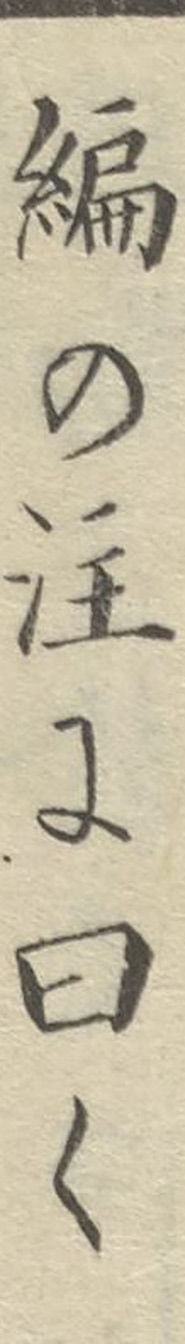編の注に曰く
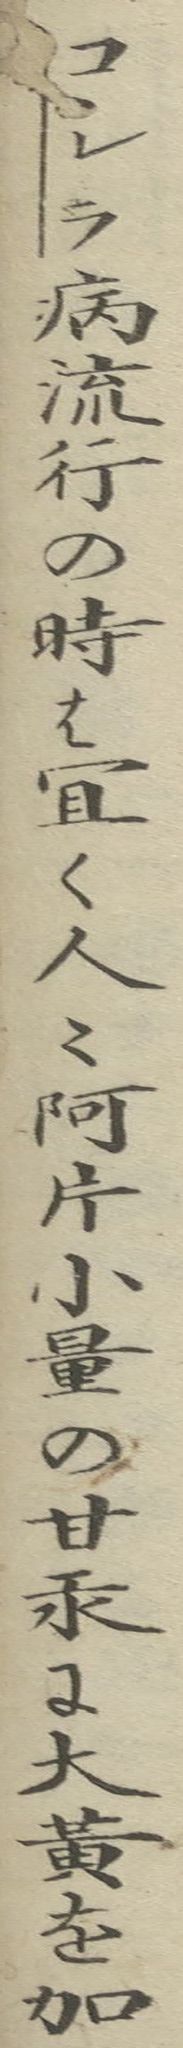コレラ病流行の時は宜く人々阿片小量の甘汞に大黄を加
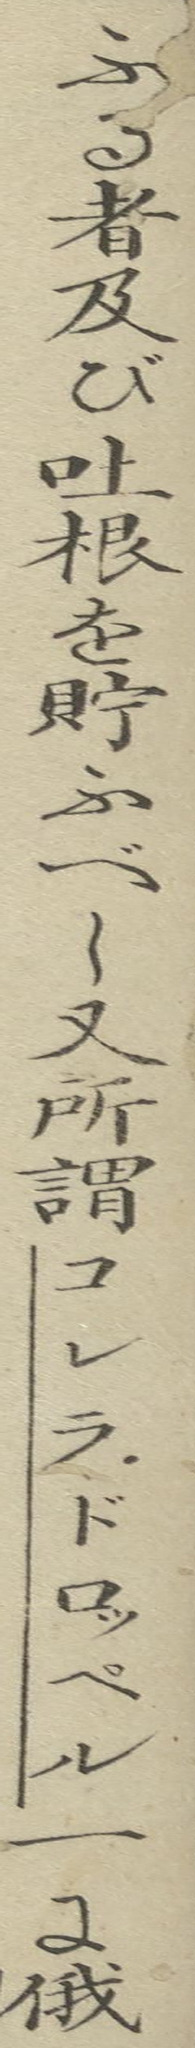ふる者及び吐根を貯ふべし又所謂コレラドロッペル一に俄
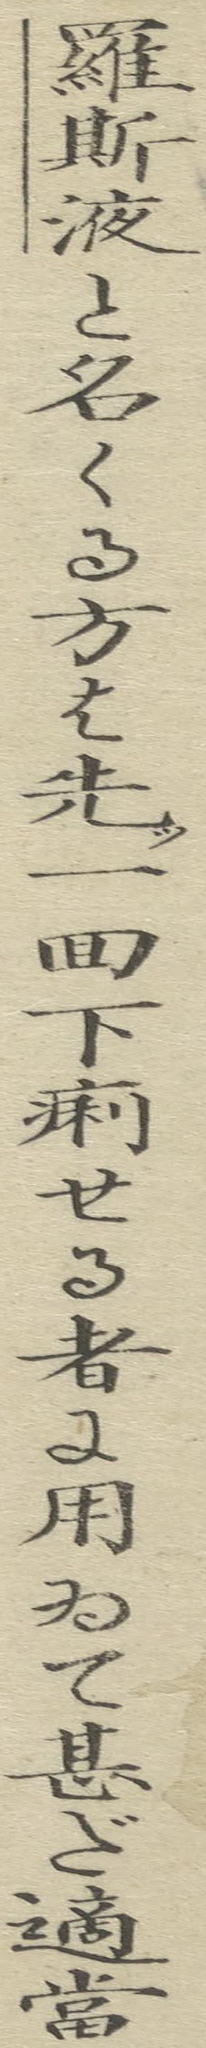羅生斯液と名くる方は先一回下痢せる者に用ゐて甚だ適當
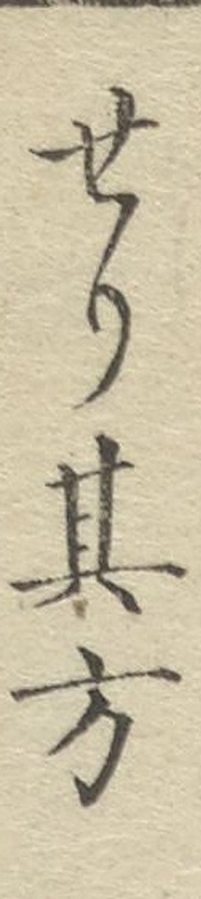せり其方
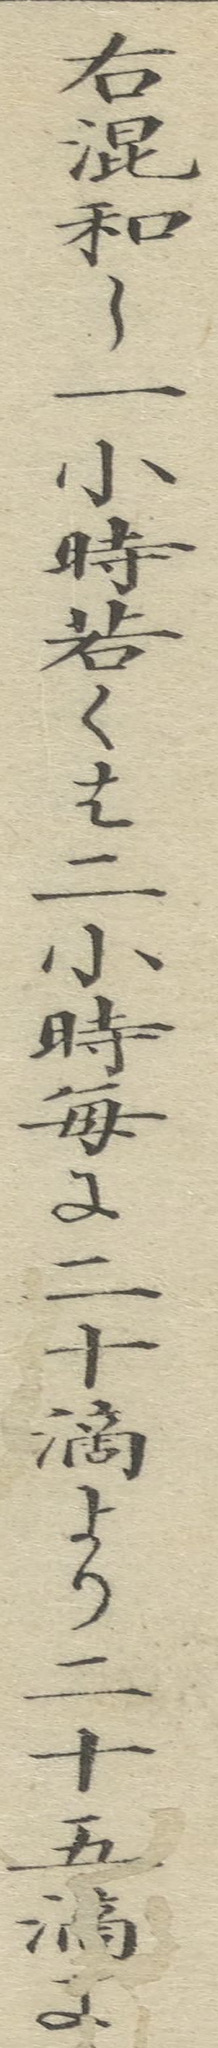右混和し一小時若くは二小時毎に二十滴より二十五滴に

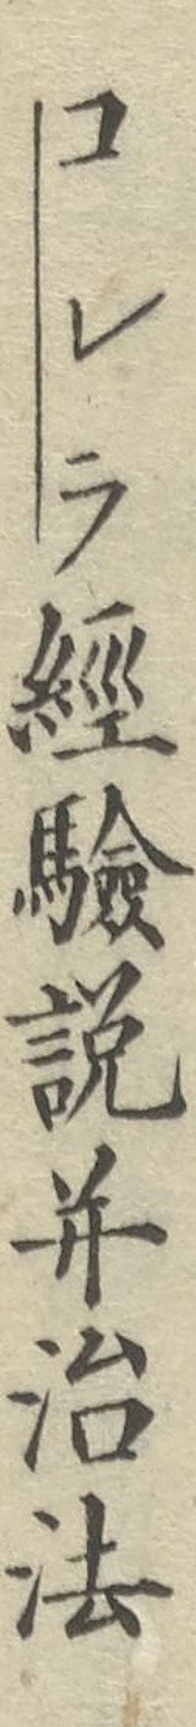コレラ経験説并治法
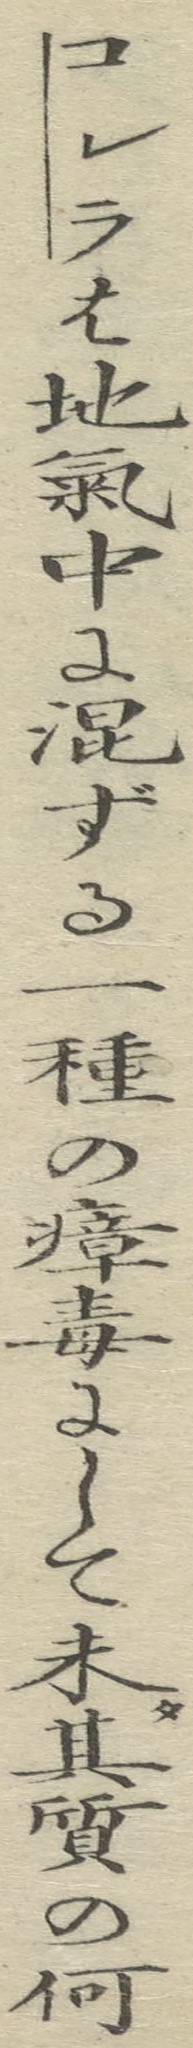コレラは地氣中に混ずる一種の瘴毒にして未其質の何
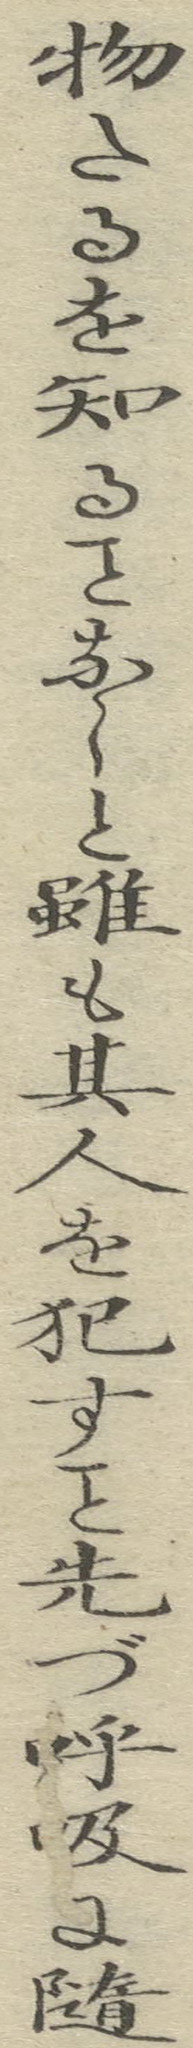物たるを知ることなしと雖も其人を犯すこと先づ呼吸に随
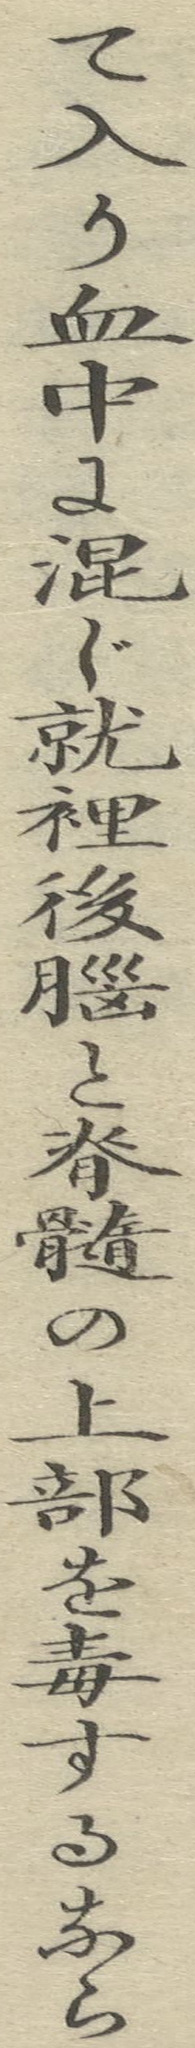て入り血中に混じ就裡後脳と脊髄の上部を毒するなら
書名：官版疫毒預防説　全
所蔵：東京大学総合図書館 General Library in the University of Tokyo, JAPAN
